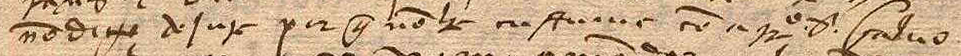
n̄o digo de Jure porq̄ nō he custume c̄o arros. saluo
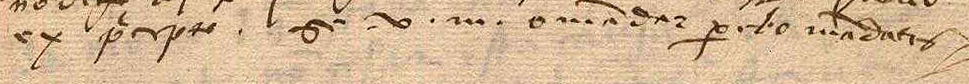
ex p̄cepto se v. m. o mādar ꝑ elo mādates
